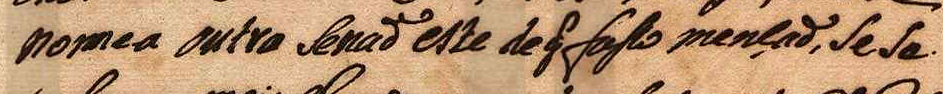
nomea outro senaõ este de q̄ fasso mençaõ, se se
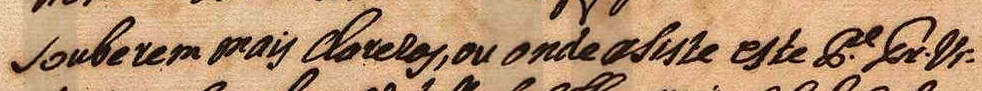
souberem mais clarezas, ou onde asiste este P.e Fr. Vi
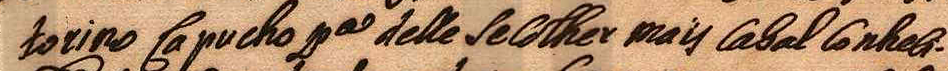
torino Capucho pa delle se colher mais cabal conheci
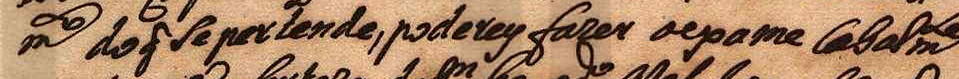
mto do q̄ se pertende, poderey fazer o exame cabalm.te
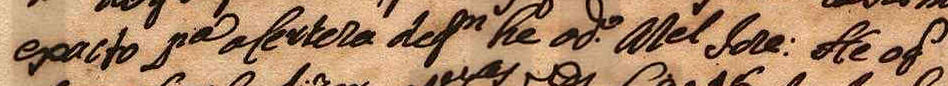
exacto pa a Certeza de qm he o d.o Mel Ioze: He o q̄
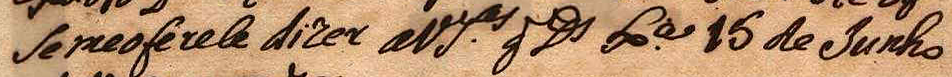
se me oferece dizer a V S.as q̄ Ds̄ Lx.a 15 de Iunho
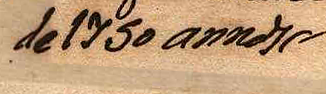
de 1750 annos
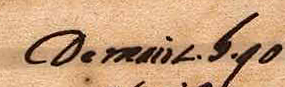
De maio 1.5.90
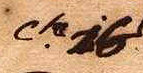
c.ta i6
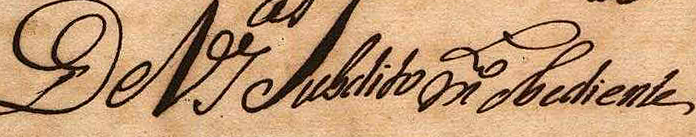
De V Sas Subdito mto obediente
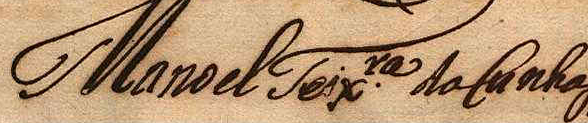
Manoel Teix.a da Cunha
